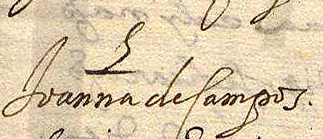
Joanna de Campos.
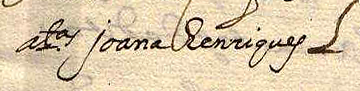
a t.as joana henriques L
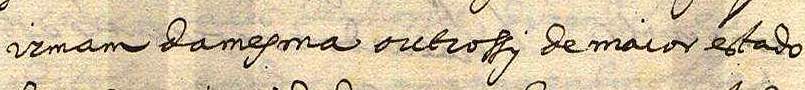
irmam da mesma outrossy de maior estado
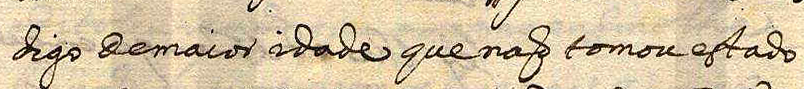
digo de maior idade que naõ tomou estado
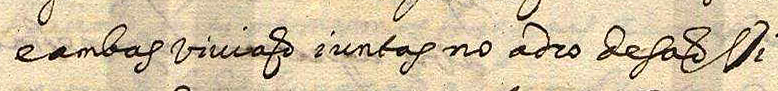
e ambas viuiaõ iuntas no adro de saõ Vi
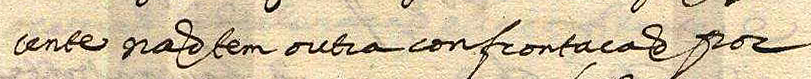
cente naõ tem outra confrontaçaõ por
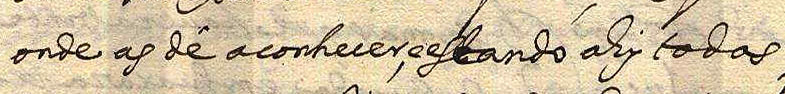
onde as dê a conhecer, e estando ahy todas
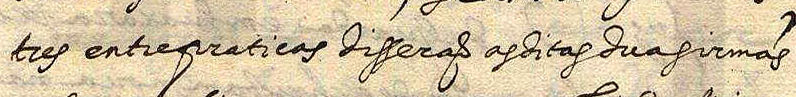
tres entre praticas disseraõ as ditas duas irmās
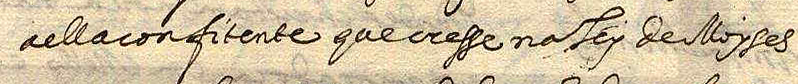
a ella confitente que cresse na ley de Moyses
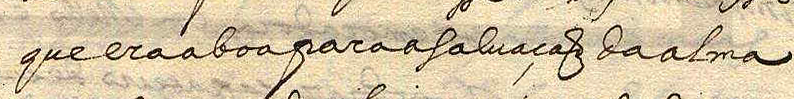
que era a boa para a saluaçaõ da alma
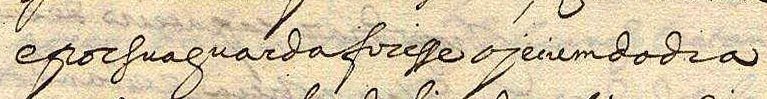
e por sua guarda fizesse o jeium do dia
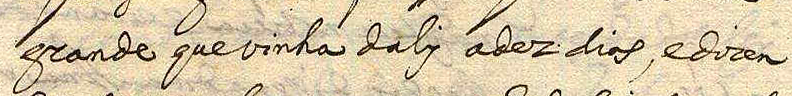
grande que vinha daly a dez dias, e dizen
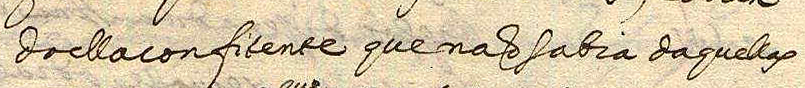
do ella confitente que naõ sabia daquellas
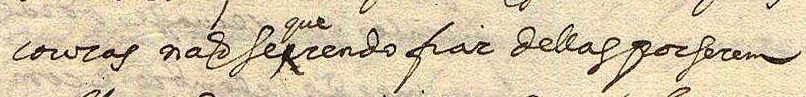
couzas naõ se querendo fiar dellas por serem
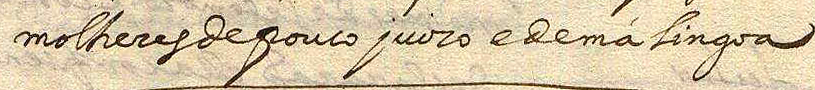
molheres de pouco juizo e de má lingoa
